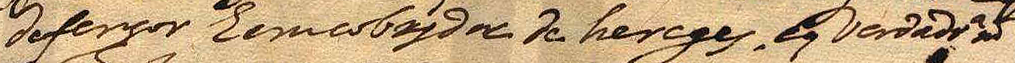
defensor E emcobrjdor de hereges e q̄ verdadramte
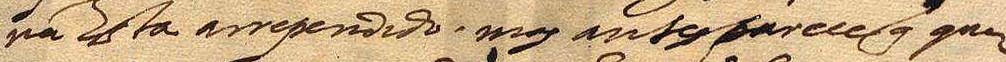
nā Esta arrependido mas antes parece q̄ quer
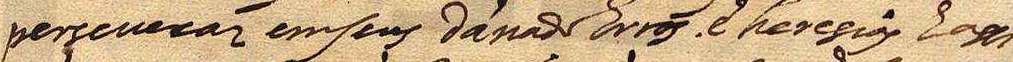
perseuerar em seus dānado Erros e heresias E assi
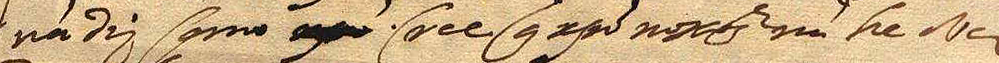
nā diz Como _ Cree q̄ xpō nosso sor nā he o ver
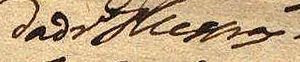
dadro Messias.
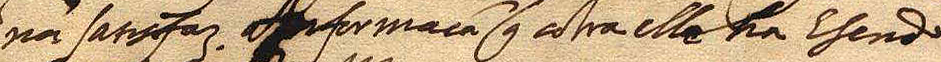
nā satisfaz a Jnformaçā q̄ cōtra elle ha E sendo
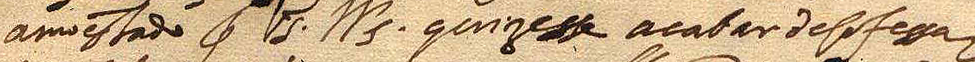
amoestado p̄ vs. Ms. quizesse acabar de Cōfessar
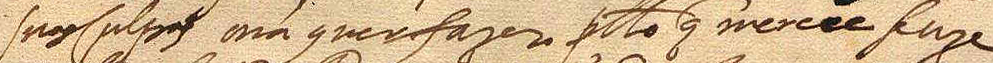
suas Culpas o nā quer fazer pll̄o q̄ merece se uze
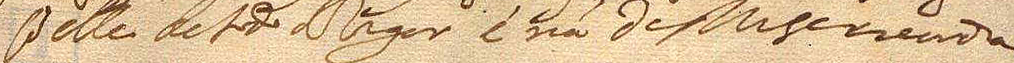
Cō elle de todo o Rigor e naõ de Misericordia
